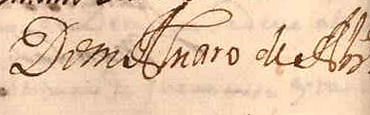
Dom Aluaro de Abr.es
